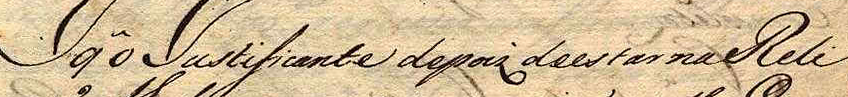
I q̄ o Iustificante depoiz de estar na Reli
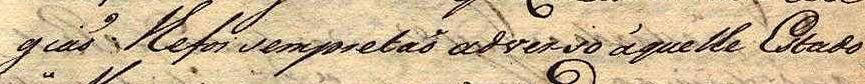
giaõ lhe foi sempre taõ adver-so áquelle Estado
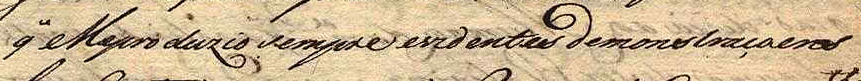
q̄ elle produzio sempre evidentes demonstraçaens
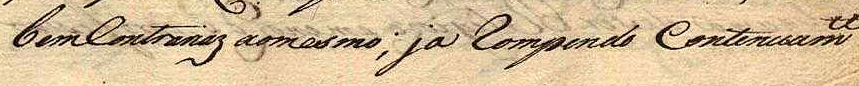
bem Contrariaz ao mesmo; ja Rompendo Contenuam.te
